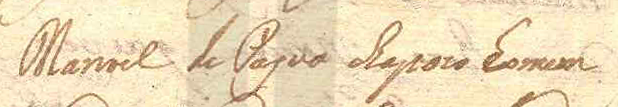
Manoel de Payva Rapozo homem
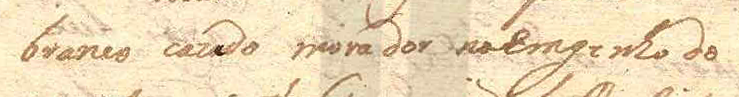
branco cazado morador no Emgenho do
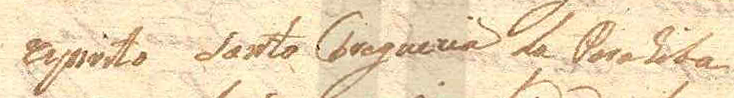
espirito santo Freguezia da Parahiba
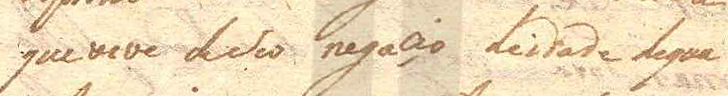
que vive de seo negocio de idade de qua
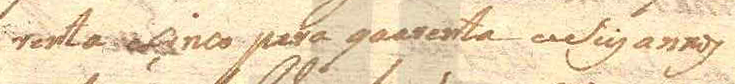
renta e cinco para quarenta e seis annos
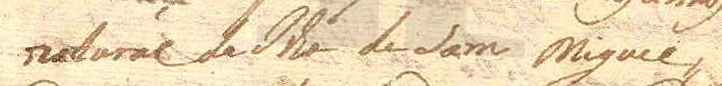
natural de Ilha de Sam Miguel,
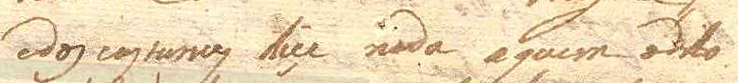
e dos costumes dice nada a quem o dito
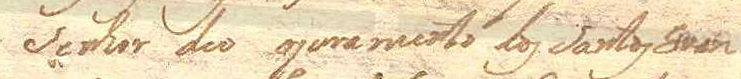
Senhor deo o juramento dos Santos Evan
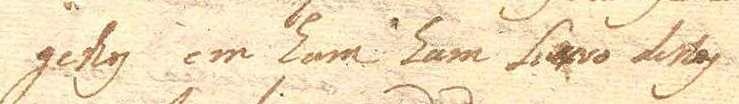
gelhos em hum hum Livro destas
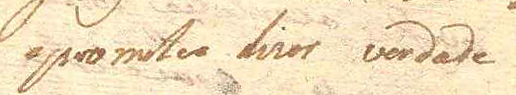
e prometeo dizer verdade
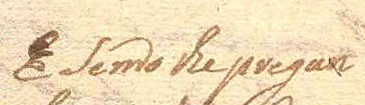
E sendo lhe pregun
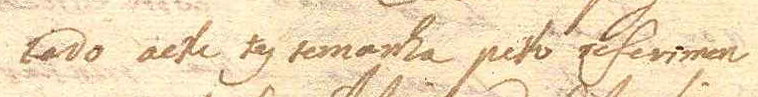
tado a elle testemunha pelo referimen
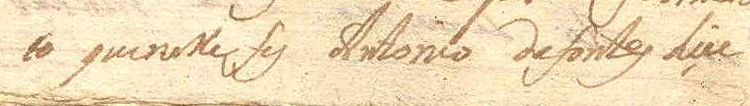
to que nelle fes Antonio da fontes dice
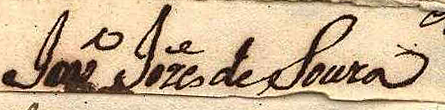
Ioaõ Iozé de Souza
